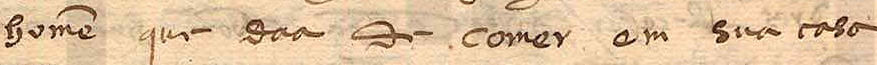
homē que daa de comer em sua casa
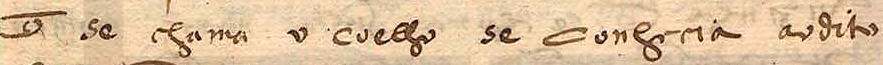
q̄ se chama o coelho se conhecia ao dito
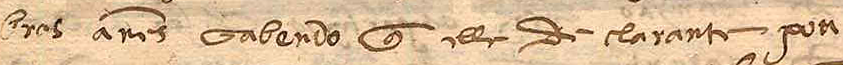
bras an̄es sabendo q̄ elle declarante pou
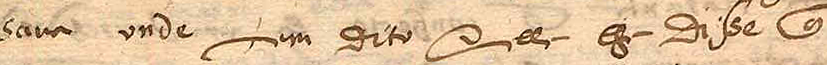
saua onde tem dito e elle lhe disse q̄
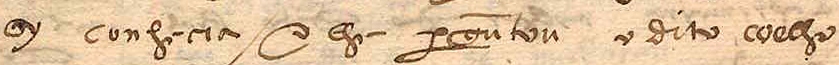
sy conhecia / e lhe ꝑgūtou o dito coelho
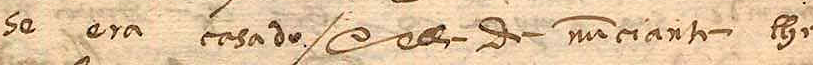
se era casado / e elle den̄uciante lhe
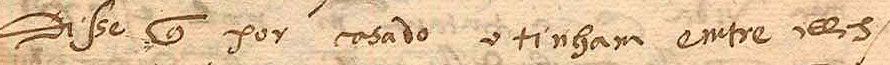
disse q̄ por casado o tinham emtre elles /
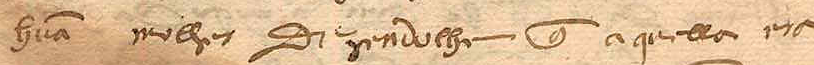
hūa molher dizendolhe q̄ aquella era
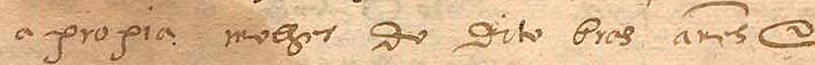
a propia molher do dito bras an̄es e
